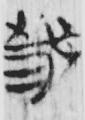歲（歲）
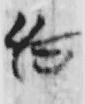左
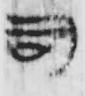司
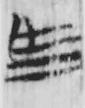馬
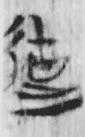适
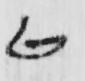㠯（以）
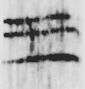王
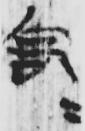命
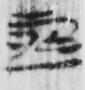亟（期）
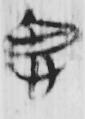思
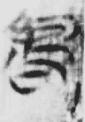舍
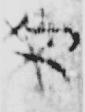枼
